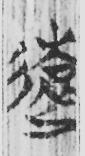遠
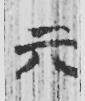亓
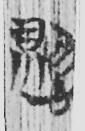惻
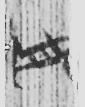母
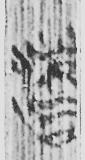{水艸害}
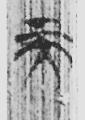天
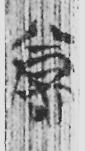常
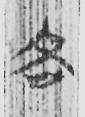各
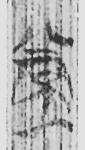當
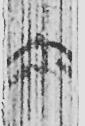尔
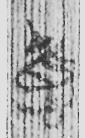惪
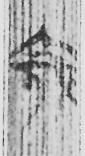{完戈}
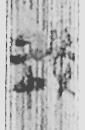戎
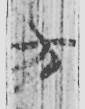方
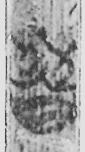晉
